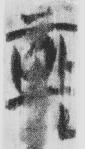亟
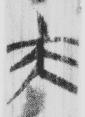夫
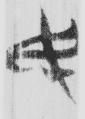民
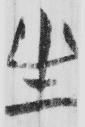生
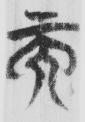而
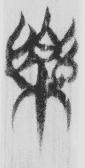樂
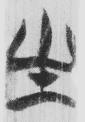生
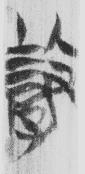{㱿子}
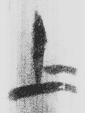上
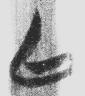㠯（以）
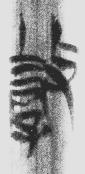{㱿子}
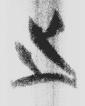之
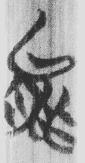能
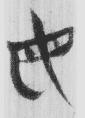母
